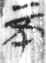不
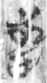疇（壽）
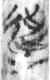逃
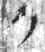人
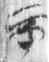不
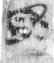○（得）
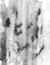利（利）
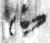㠯（以）
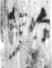敓（說）
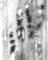○（盟）
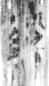詛
